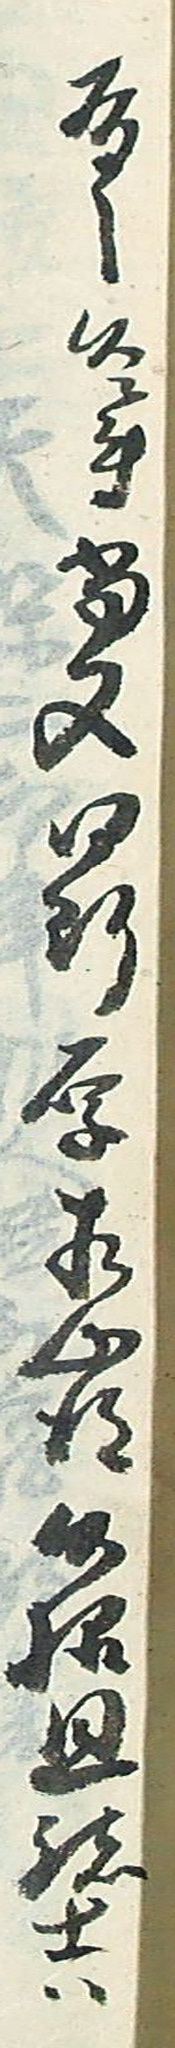有之候に付尚又同断厚相心得候様且諸士は
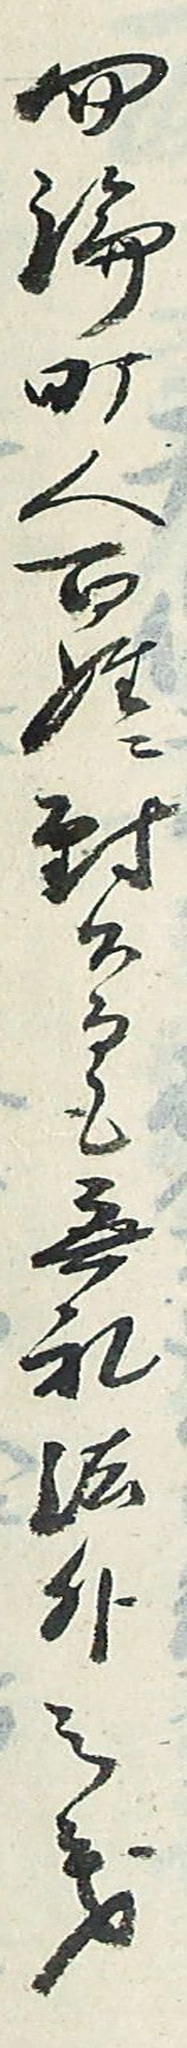勿論町人百姓に対候而も無礼法外之義
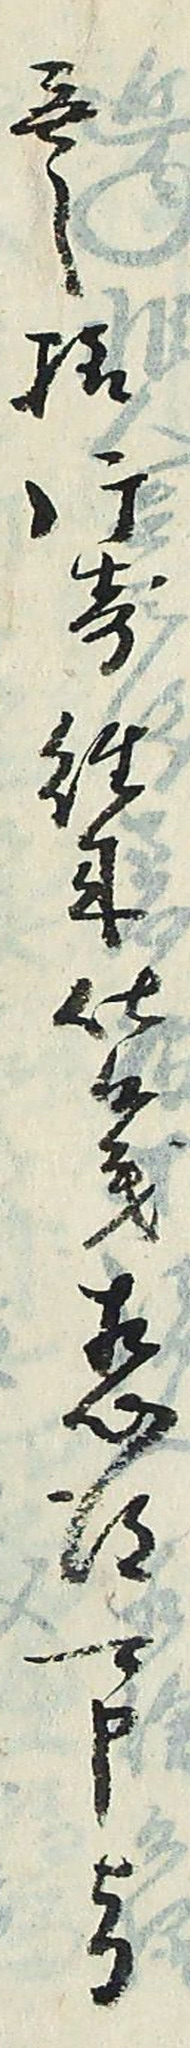無之様片寄往来仕候義相心得可申旨
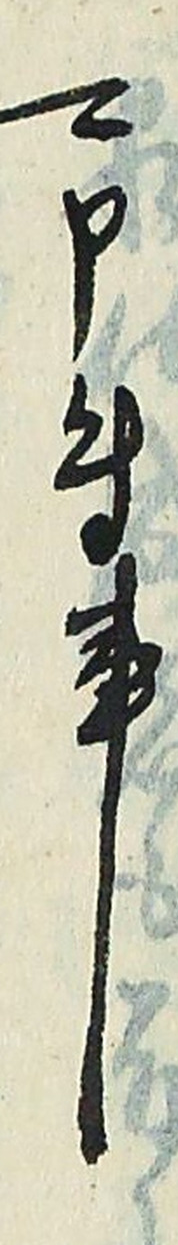可申付事
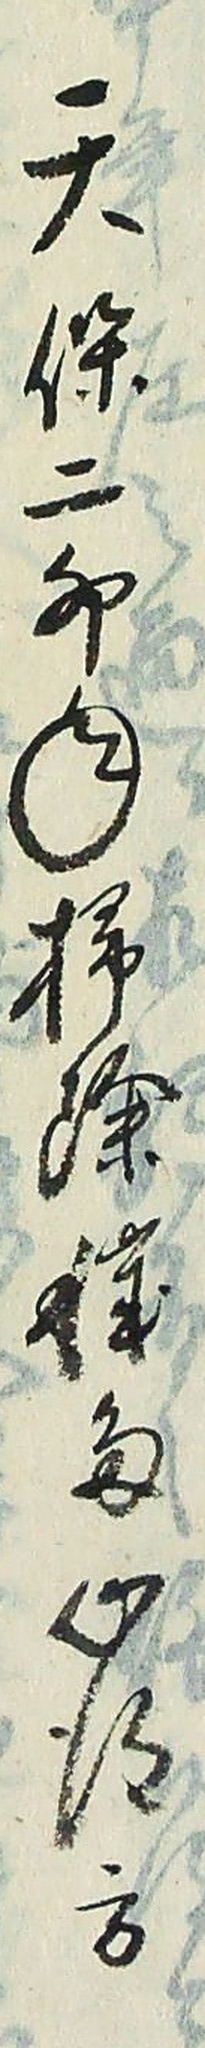天保二卯年掃除穢多心得方
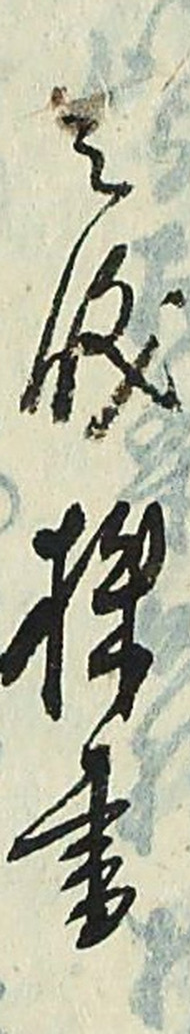之儀株書
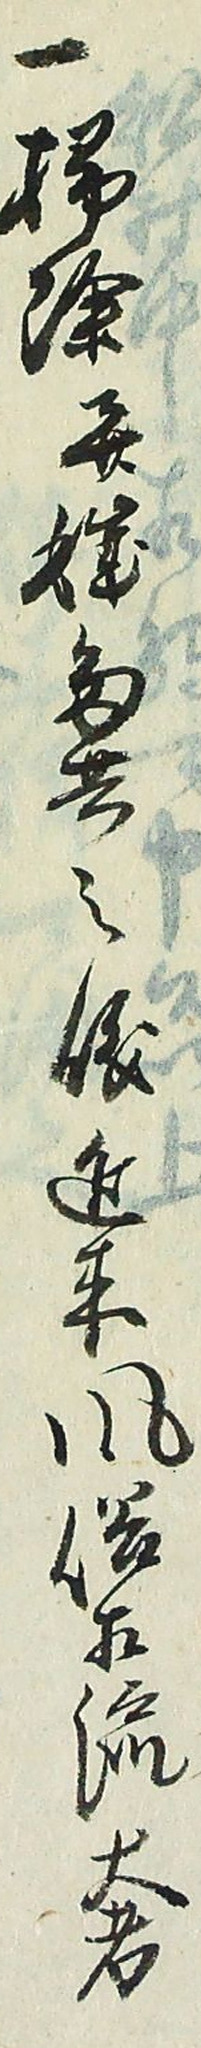一掃除幷穢多共之儀近来風俗相流奢
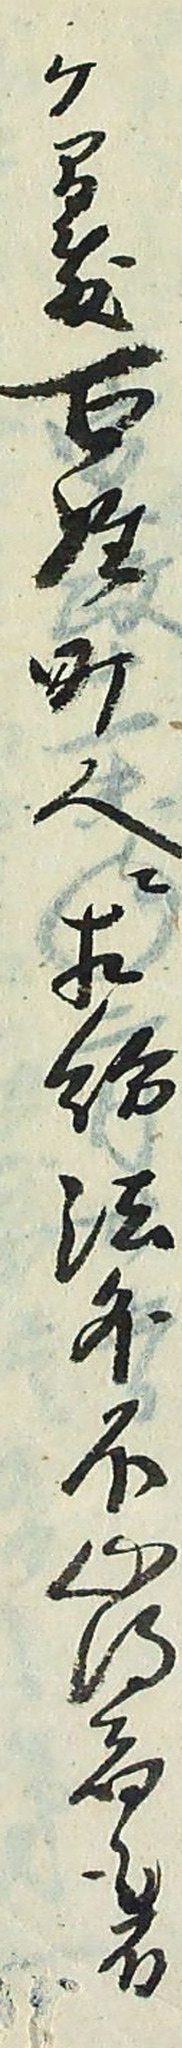ケ間敷百姓町人に相紛法外不心得者も有
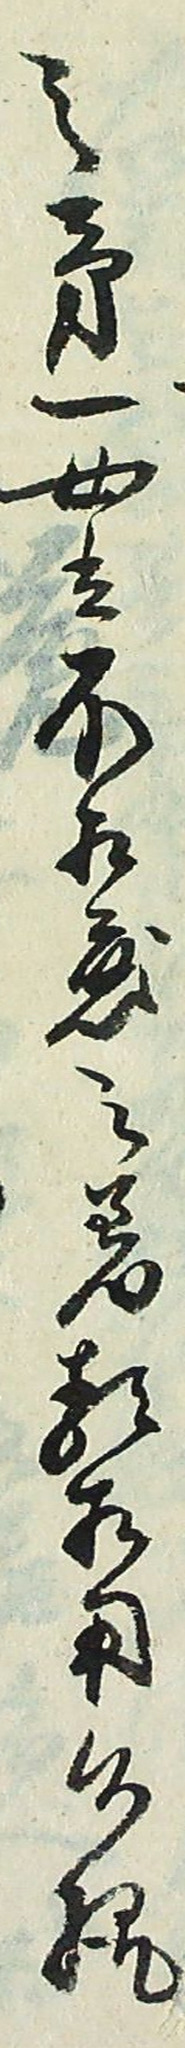之第一女立不相応之着類相用候様
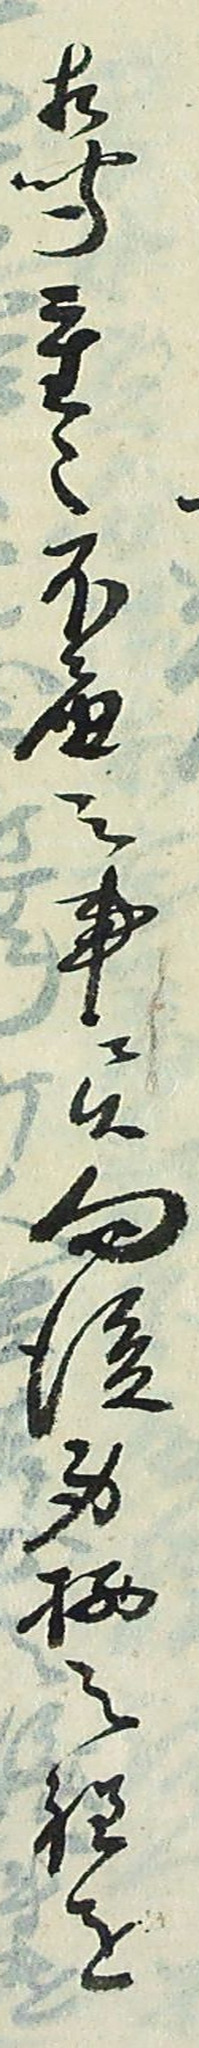相聞重々不届之事に候向後身柄之程を
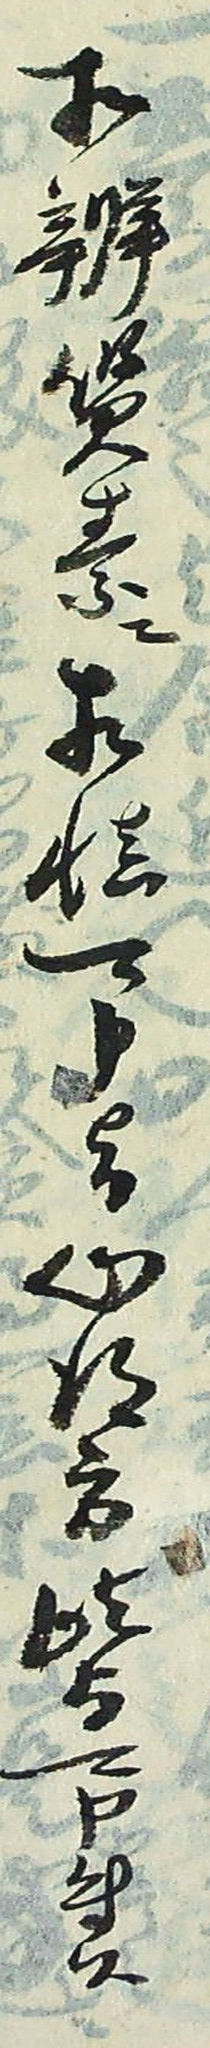相弁質素に相慎可申旨心得方屹と可申付候
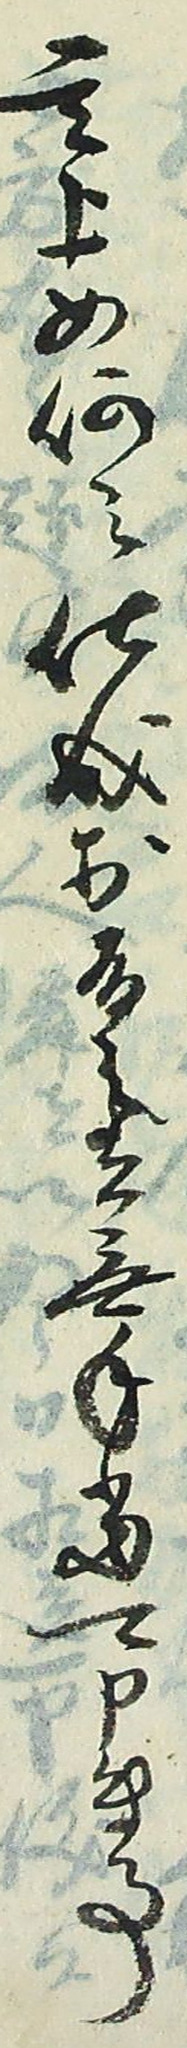其上如何之仕成於有之は無手当可申付事
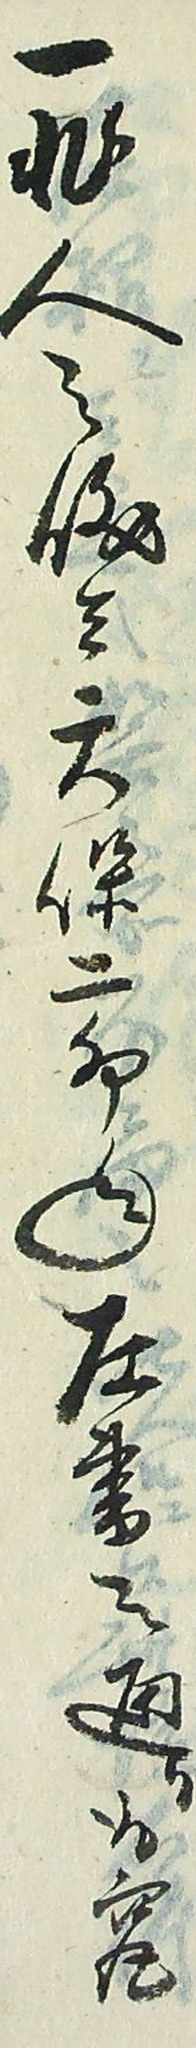一非人之儀は天保二卯年左書之通り取究
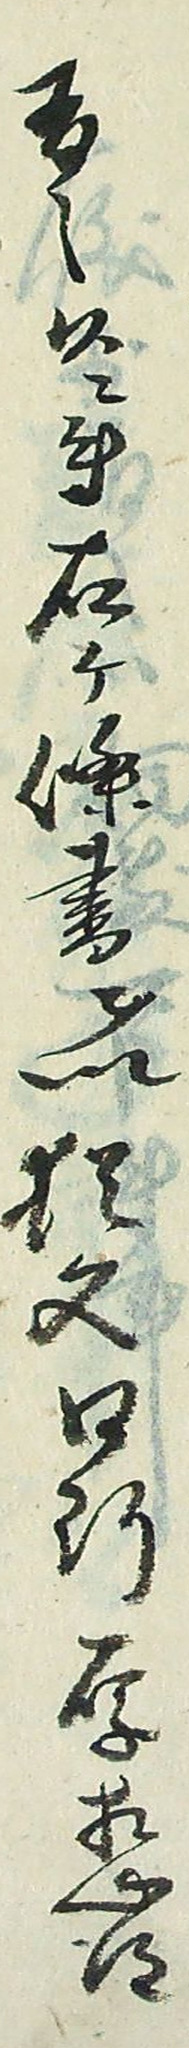有之候に付右ケ條書を以猶又同断厚相心得
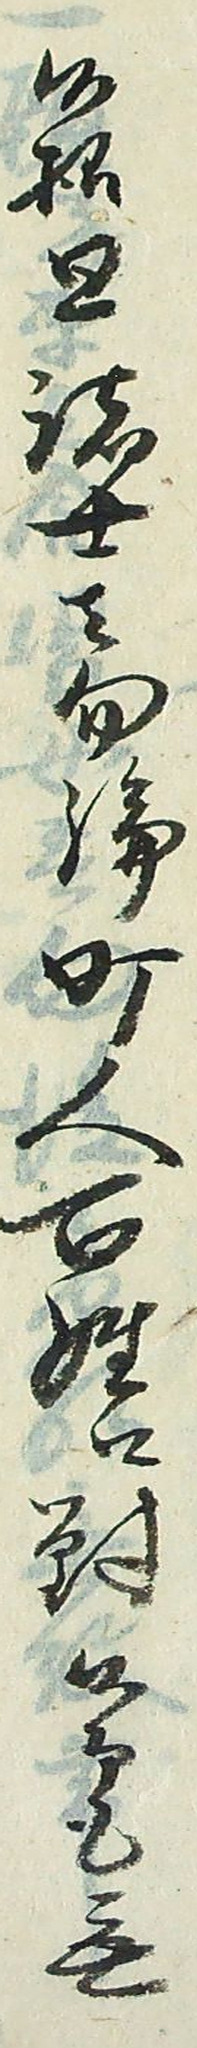候様且諸士は勿論町人百姓江対候而も無
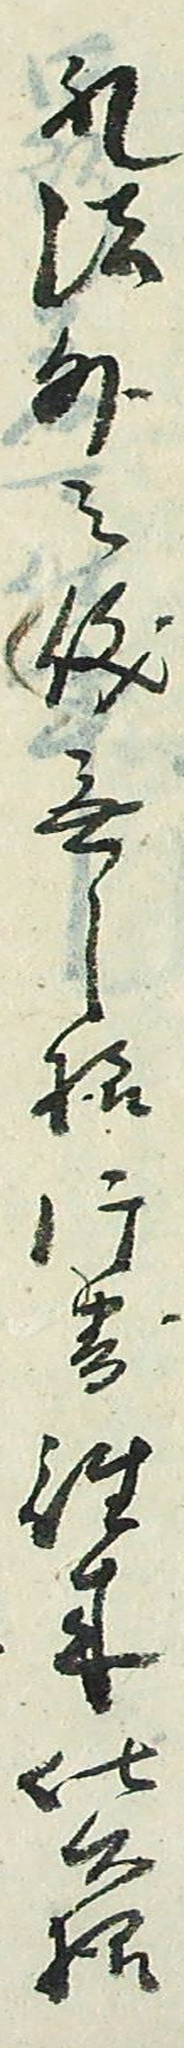礼法外之儀無之様片寄往来仕候様
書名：諸御用御□受書控
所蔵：鳴門教育大学 Naruto University of Education
